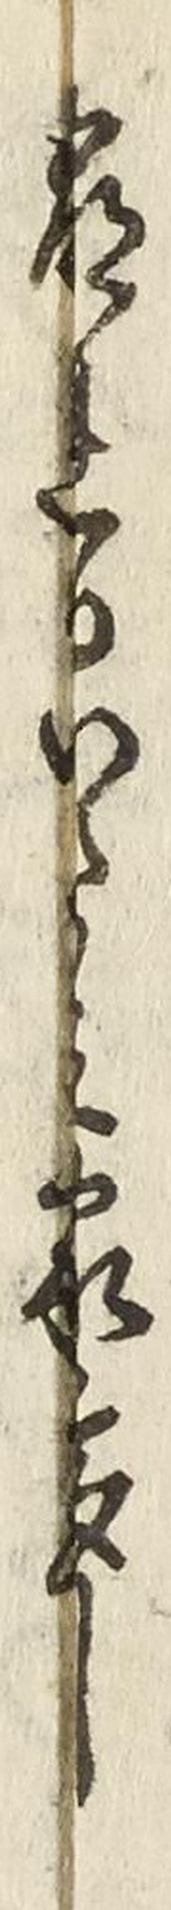崩れるいたみ家多し
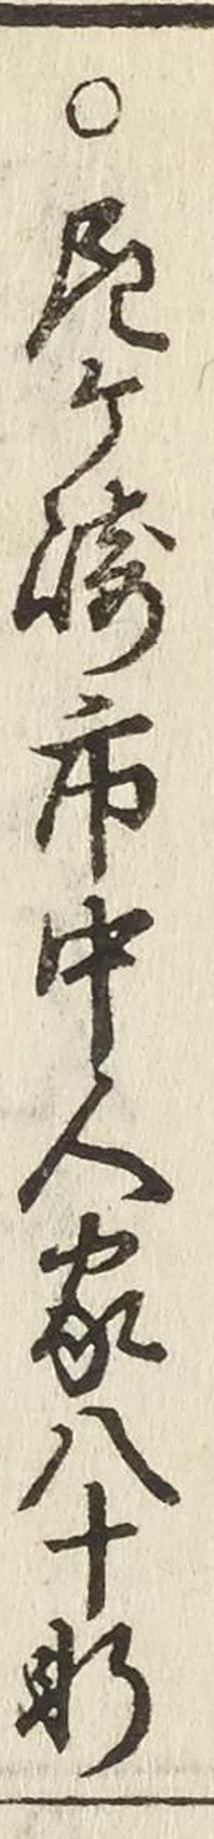○尼ヶ崎市中家八十軒
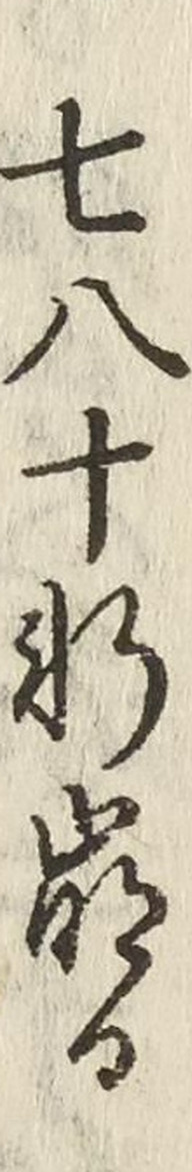七八十軒崩る
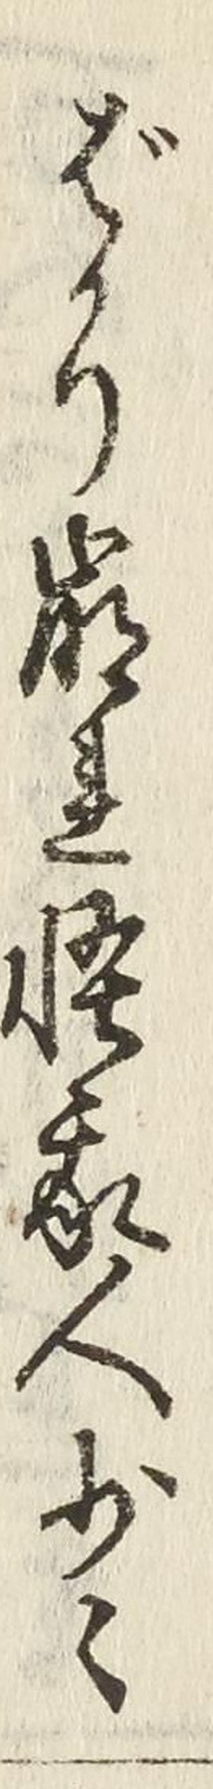ばかり崩れ怪我人少々
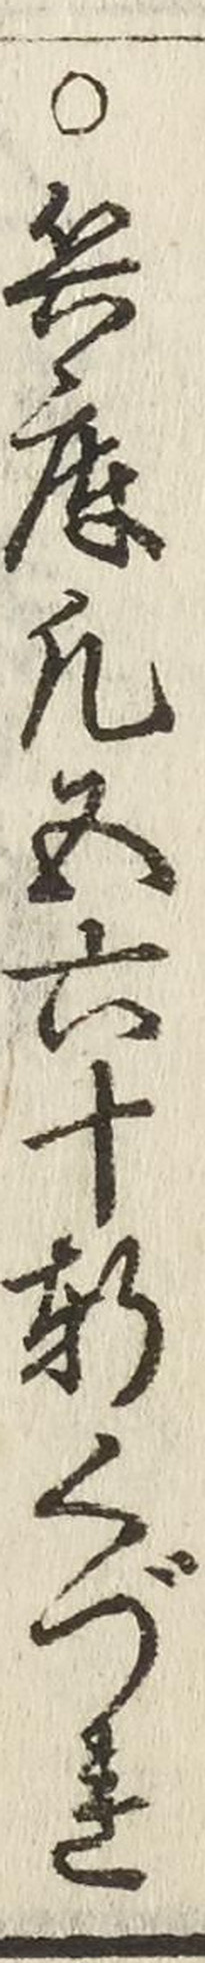○兵庫凡五六十軒くづれ
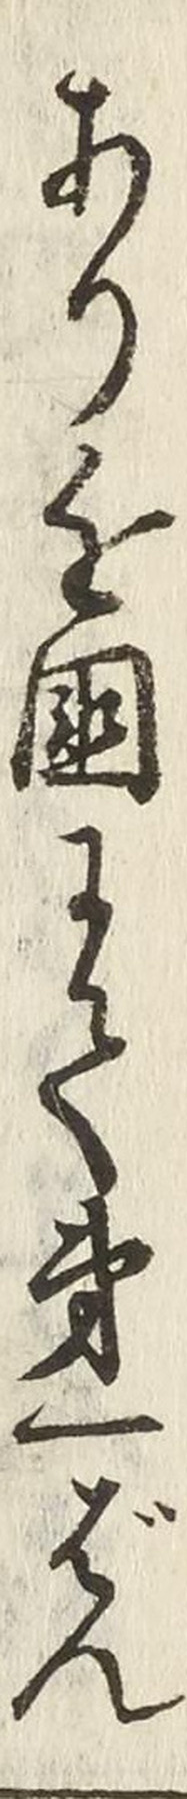あり近国にて第一ばんの
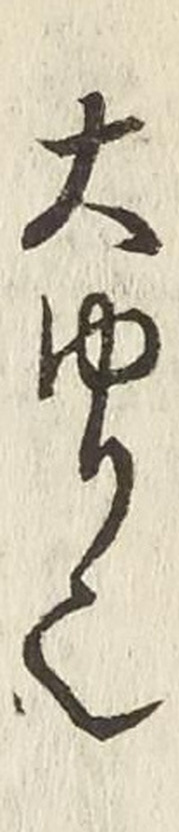大ゆり也
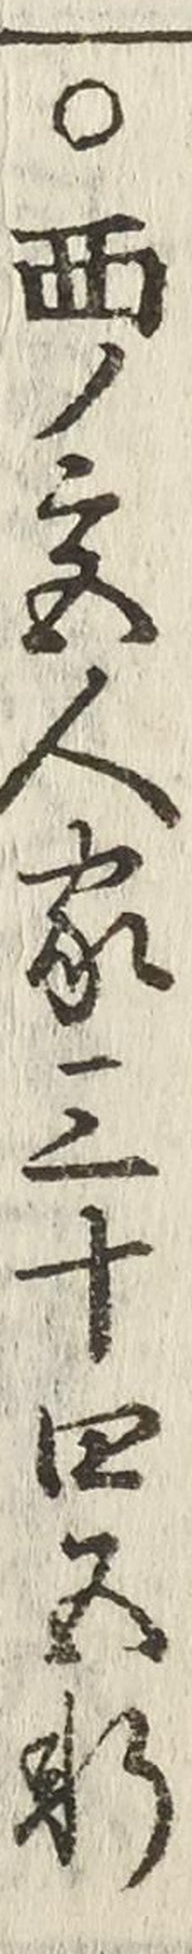○西ノ宮人家三十四五軒
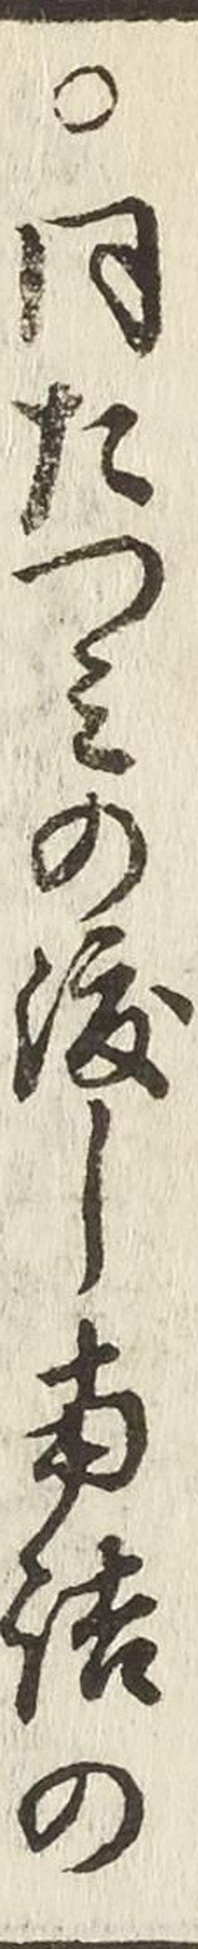○同たつみの渡し南詰の
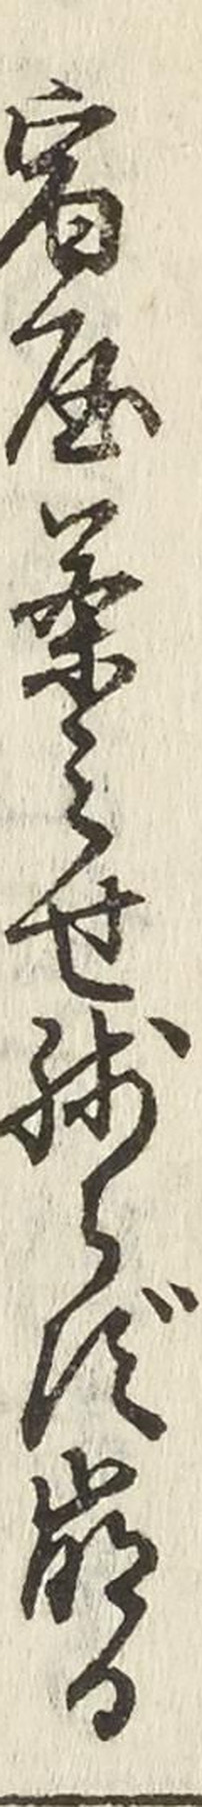宿屋茶みせ残らず崩る
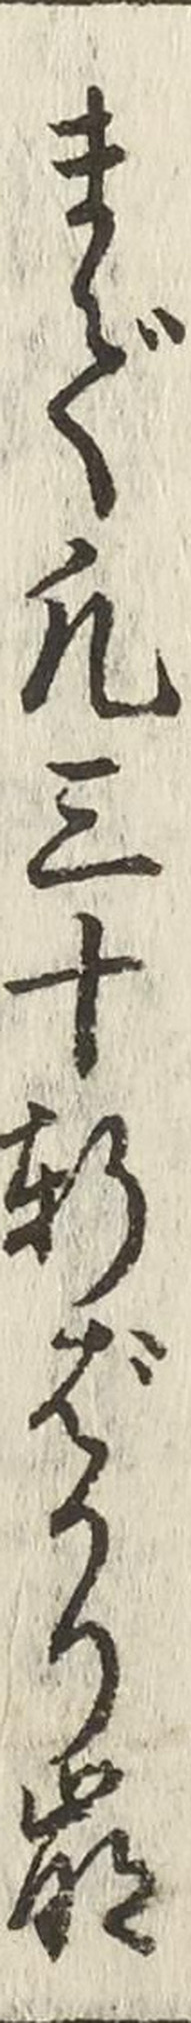まで凡三十軒ばかり崩
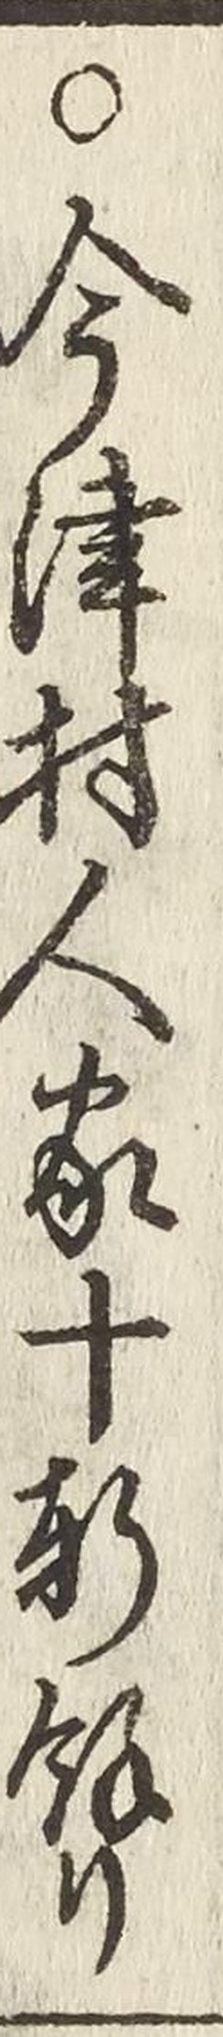○今津村人家十軒余り
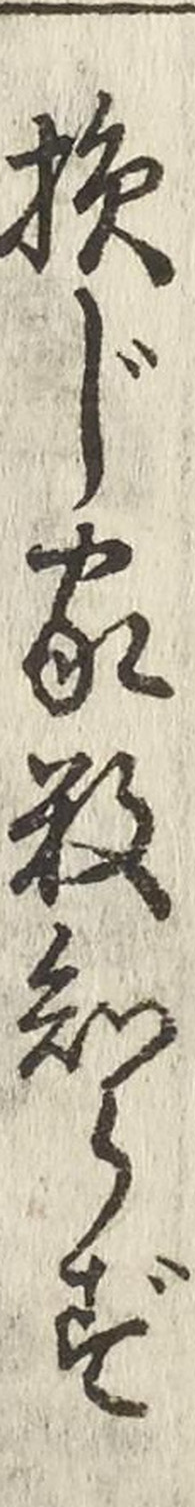損じ家数知らず
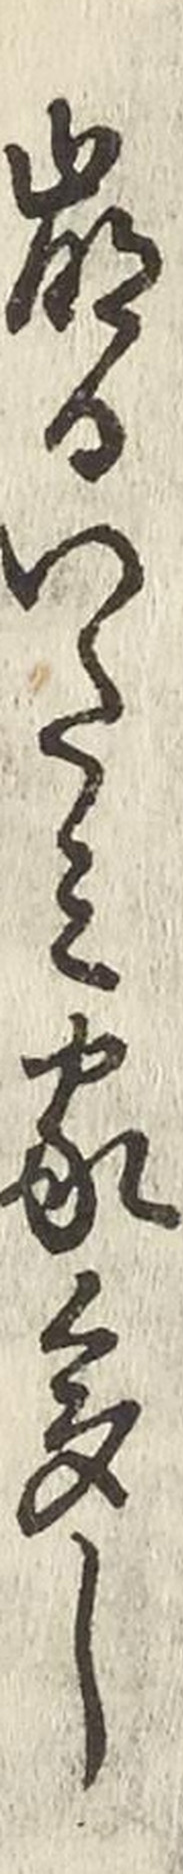崩るいたみ家多し

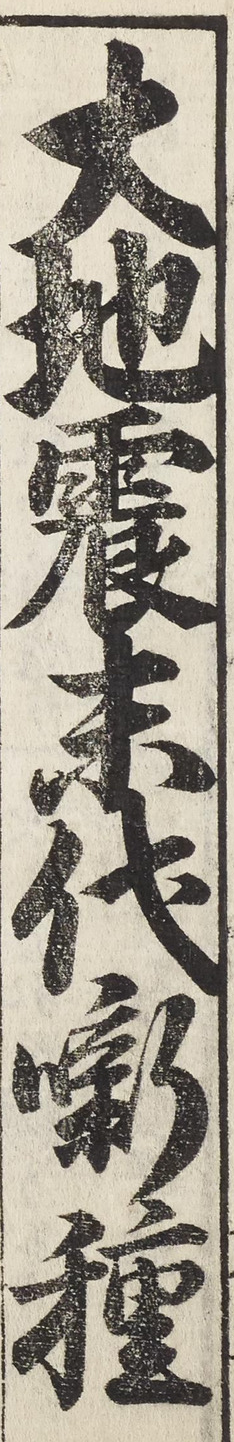大地震末代噺種
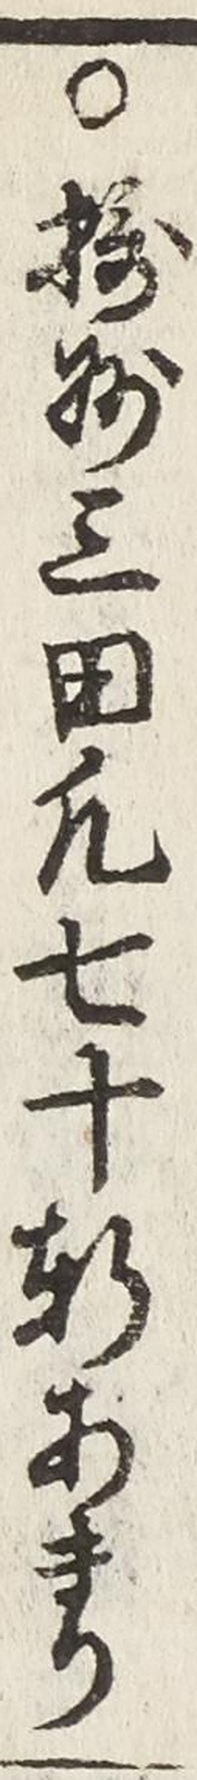○摂州三田凡七十軒あまり
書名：大地震大津浪末代噺種　（二編　全）
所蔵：東京大学地震研究所図書室 Earthquake Research Institute Library, The University of Tokyo, JAPAN
